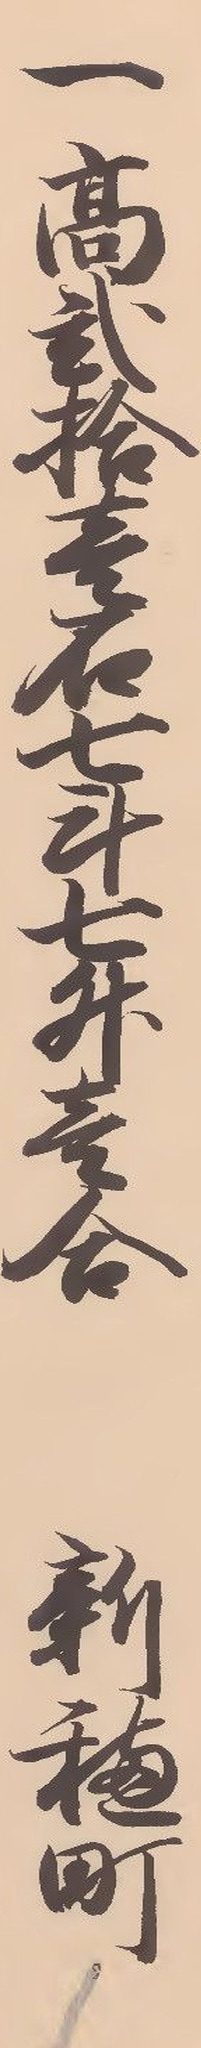一高弐拾壱石七斗七升壱合新穂町
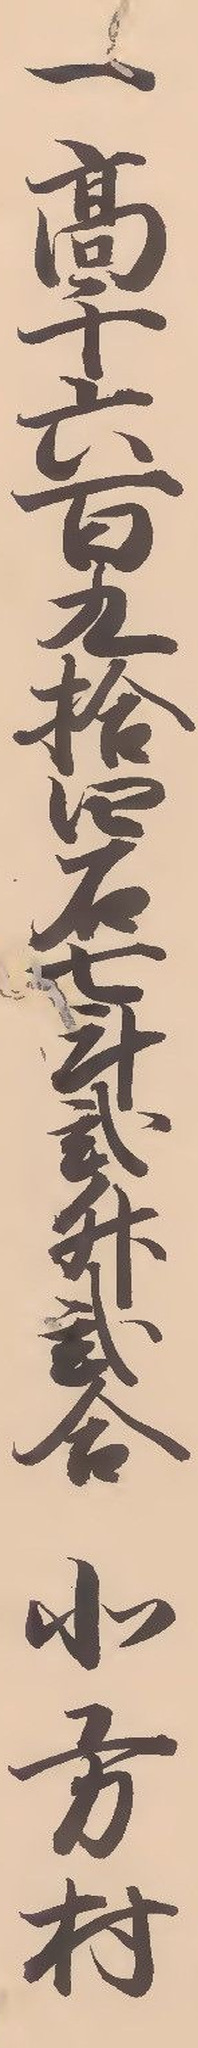一高千六百九拾四石七斗弐升弐合北方村

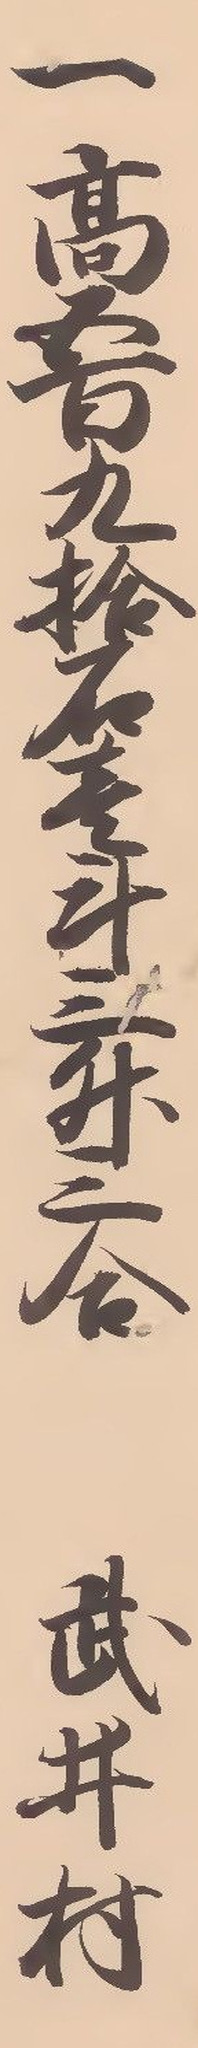一高五百九拾石壱斗三升三合武井村
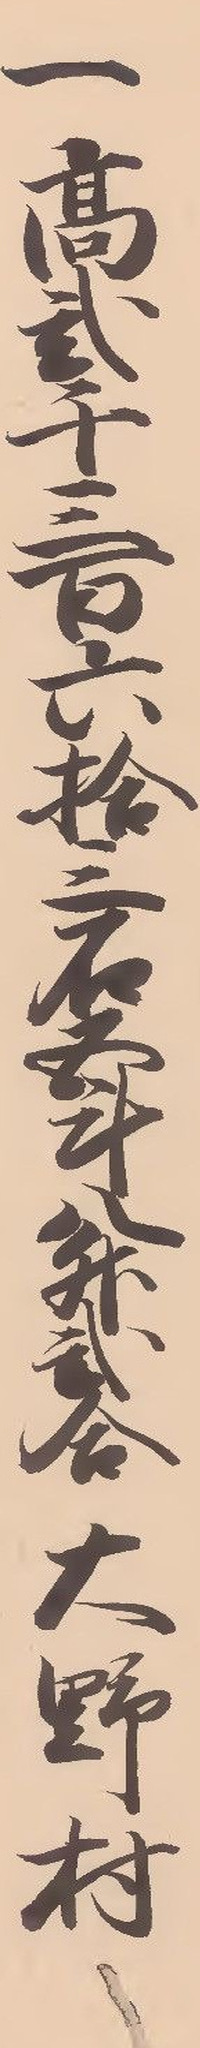一高弐千三百六拾三石五斗八升弐合大野村
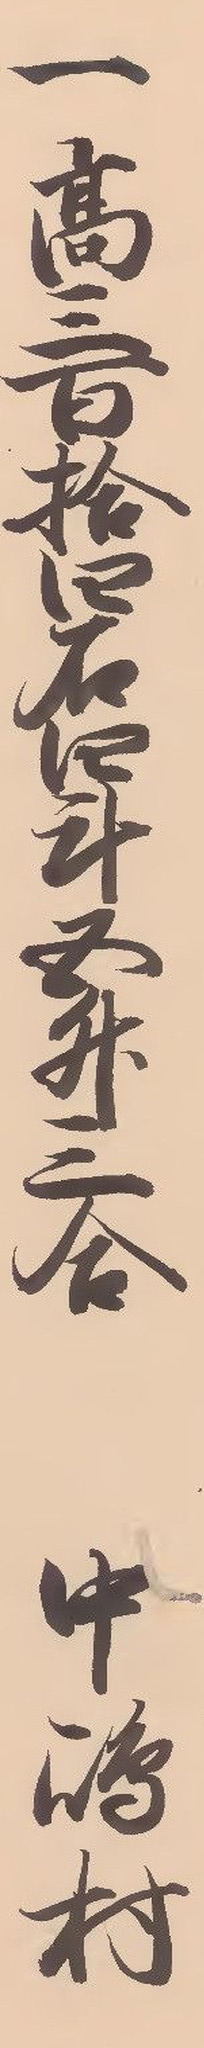一高三百拾四石四斗五升三合中島村
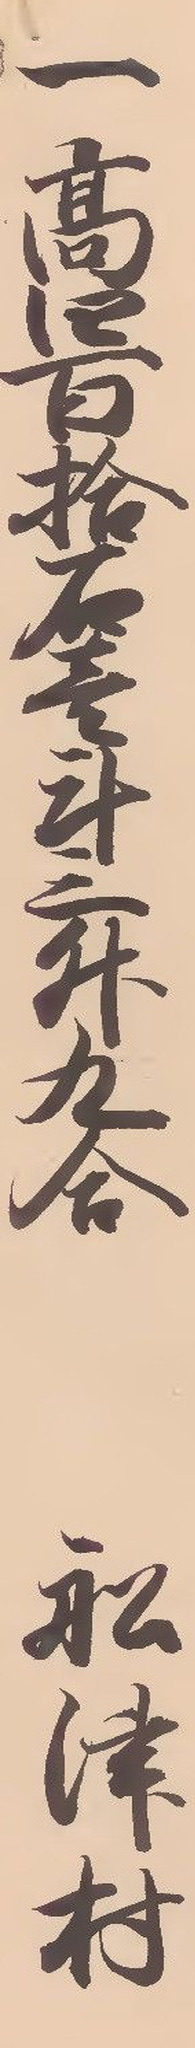一高四百拾石壱斗三升九合船津村
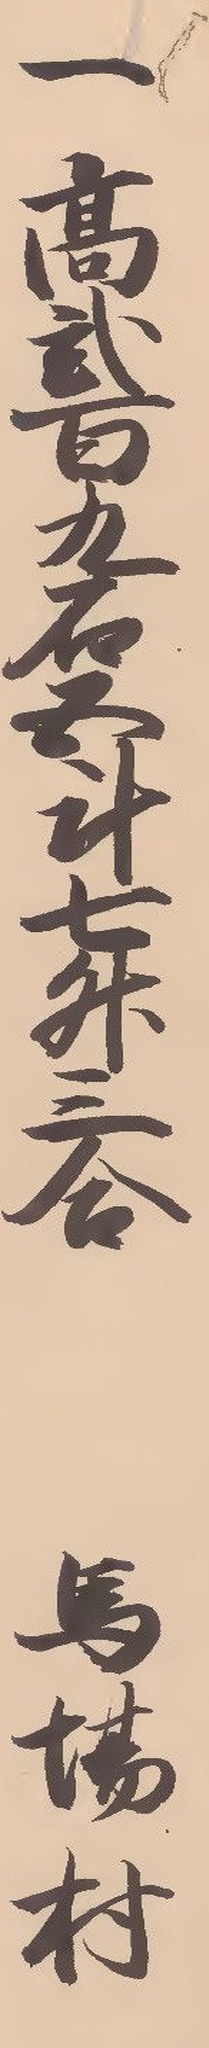一高弐百九石五斗七升三合馬場村
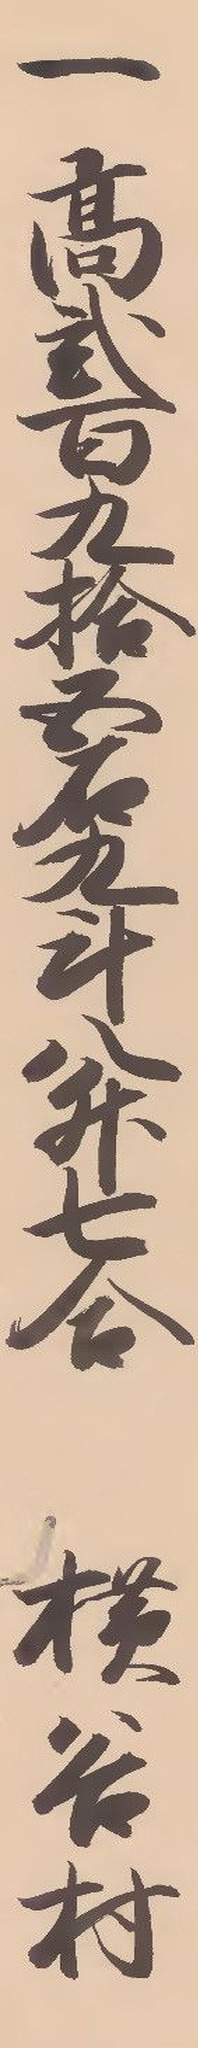一高弐百九拾五石九斗八升七合横谷村
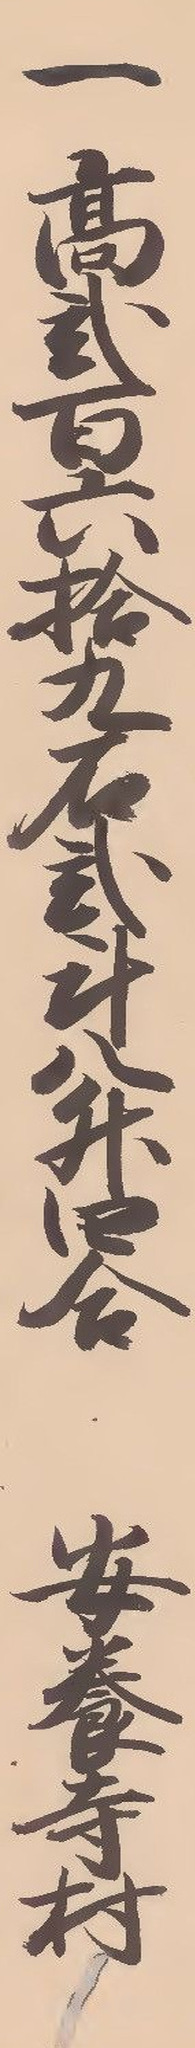一高弐百六拾九石弐斗八升四合安養寺村
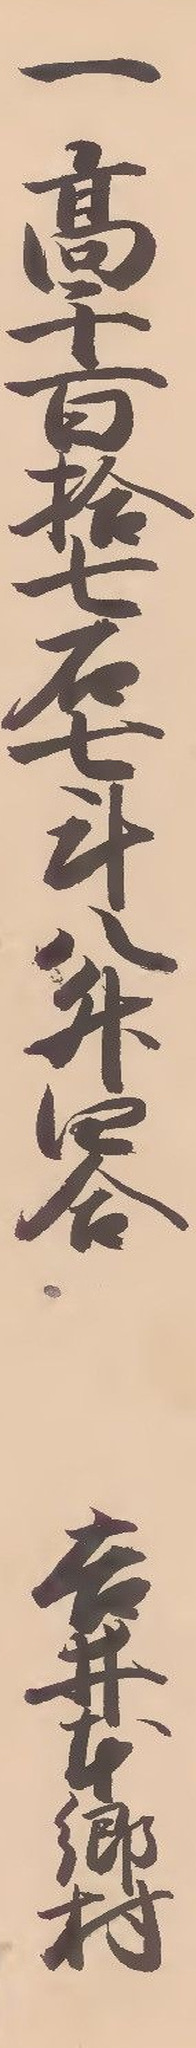一高千百拾七石七斗八升四合吉井本郷村

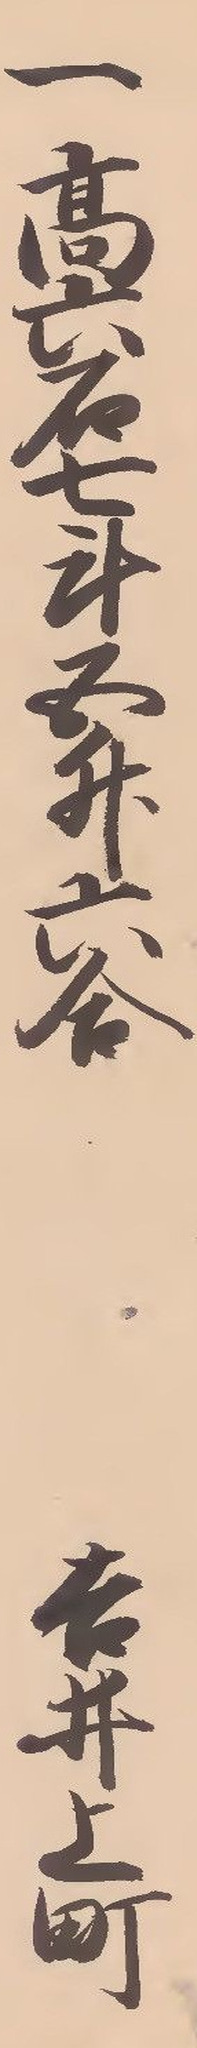一高六石七斗五升六合吉井上町
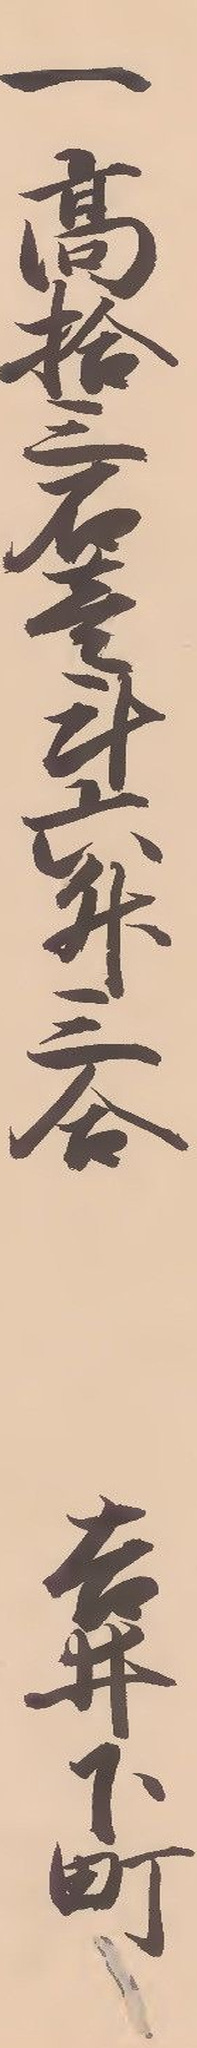一高拾三石壱斗六升三合吉井下町
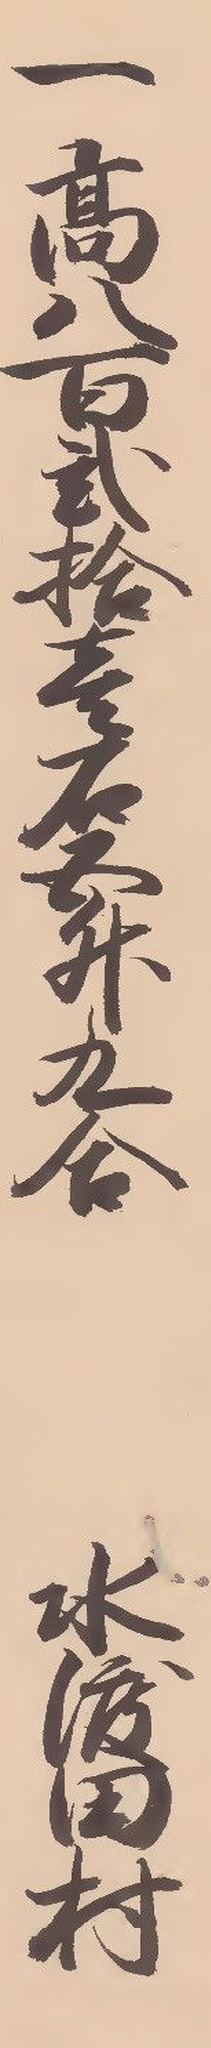一高八百弐拾壱石五升九合水渡田村
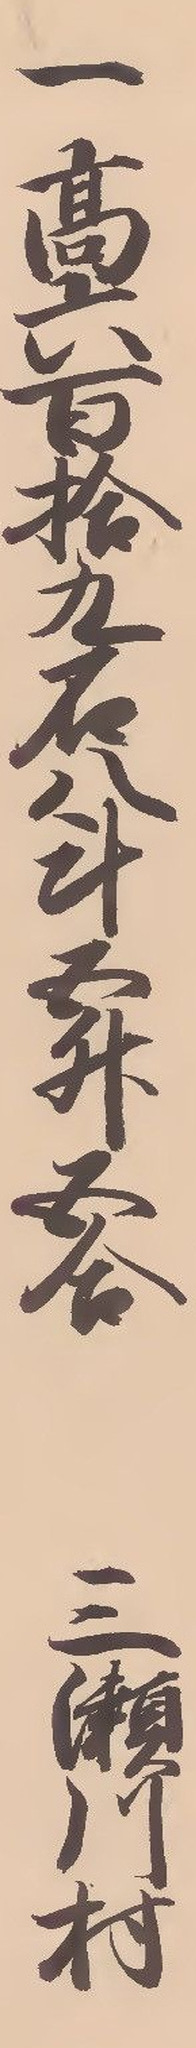一高六百拾九石八斗五升五合三瀬川村
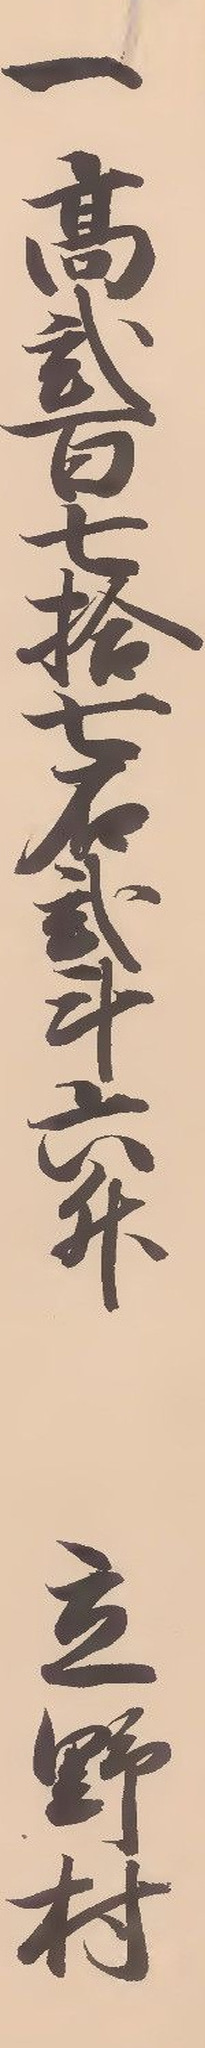一高弐百七拾七石弐斗六升立野村
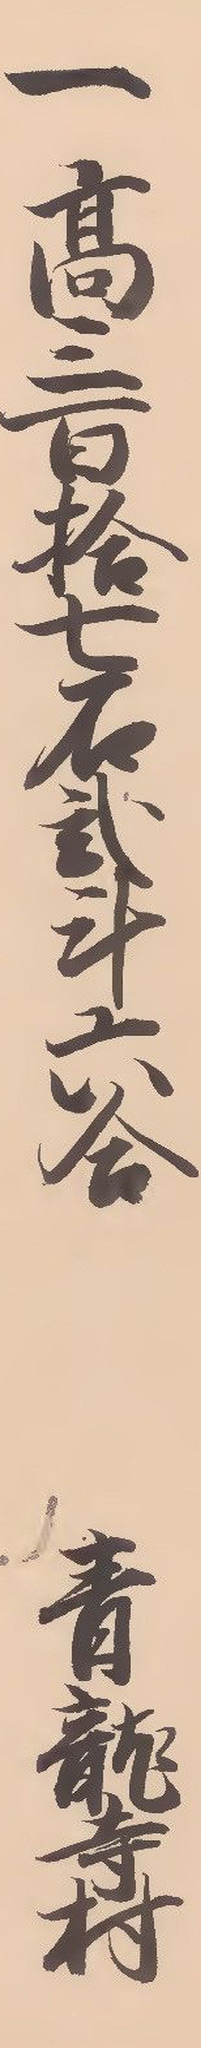一高三百拾七石弐斗六合青龍寺村
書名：佐渡国郷帳
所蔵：国立公文書館 National Archives of Japan
